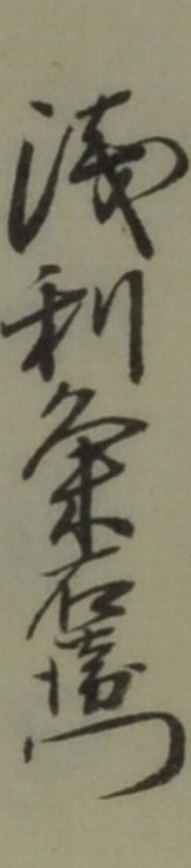浅利粂右衛門
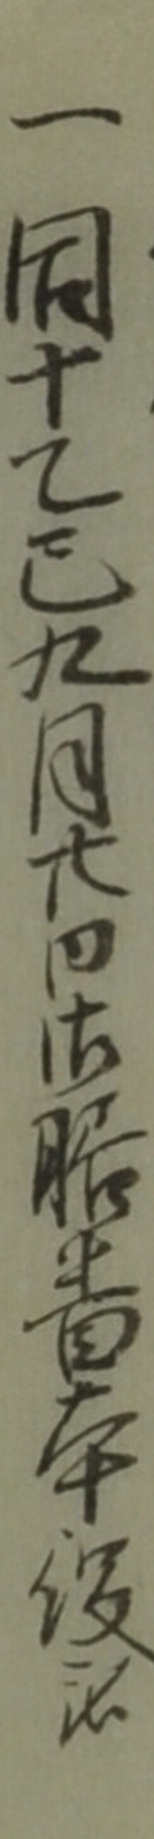一同十乙巳九月廿日御膳番本役被
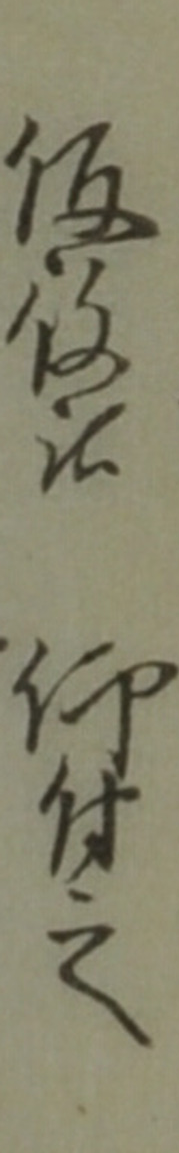仮役被仰付之
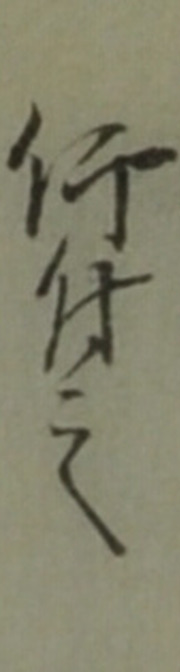仰付之
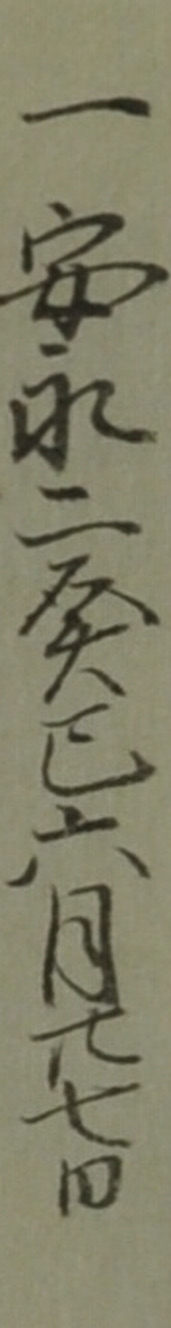一安永二癸巳六月廿七日
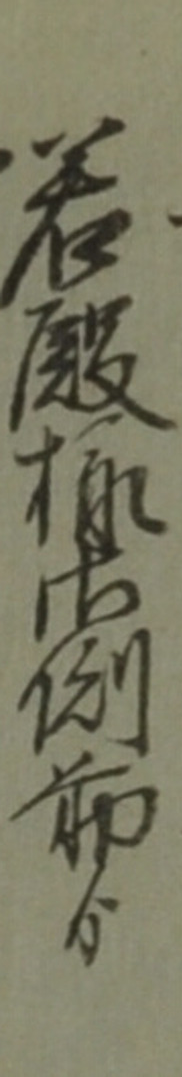若殿様御側勤ゟ
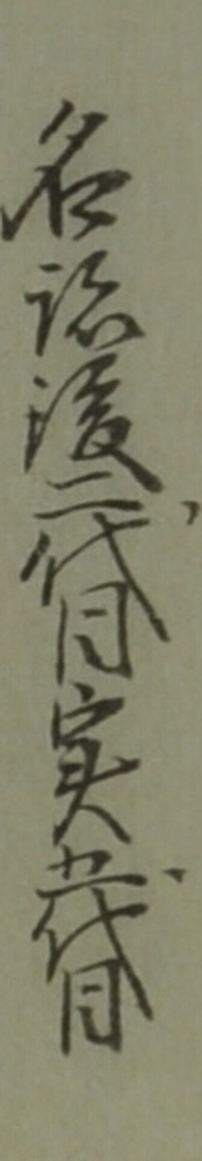名跡後二代目付実五代目
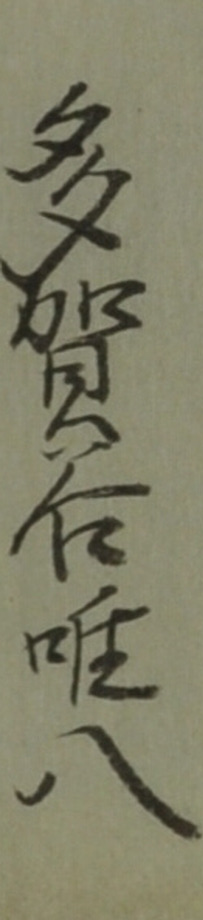多賀谷唯八
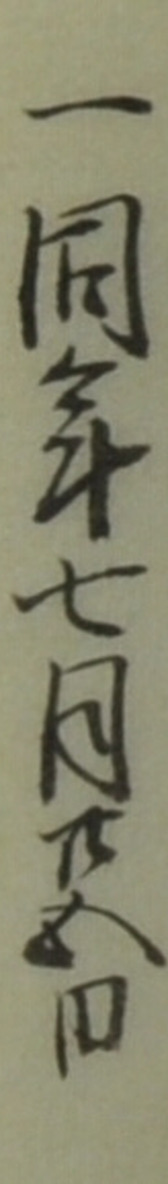一同年七月廿五日
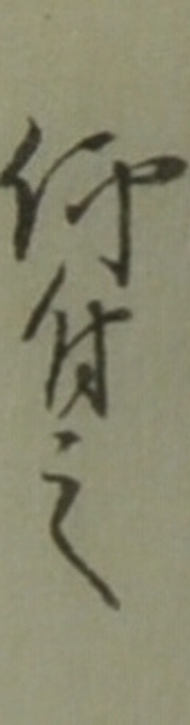仰付之
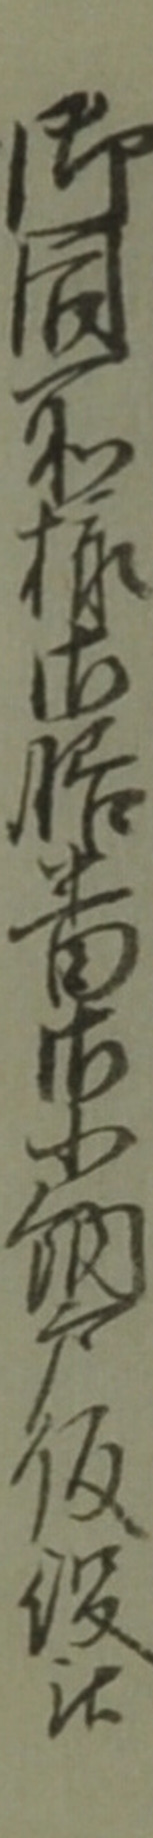御同所様御膳番御小納戸仮役被

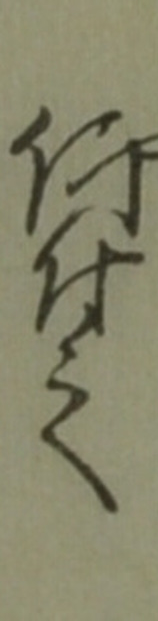仰付之
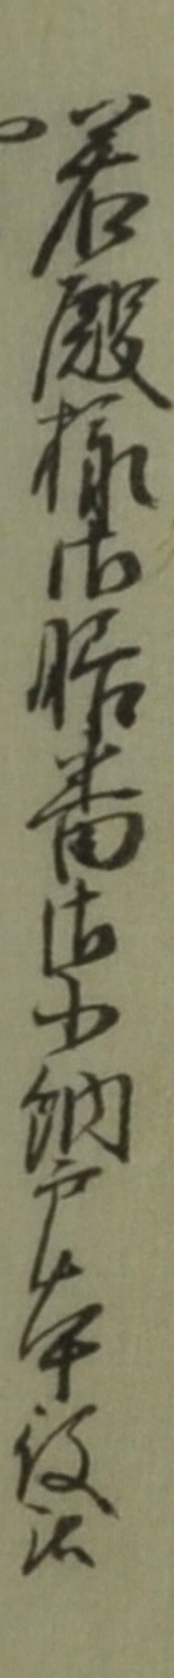若殿様御膳番御小納戸本役被
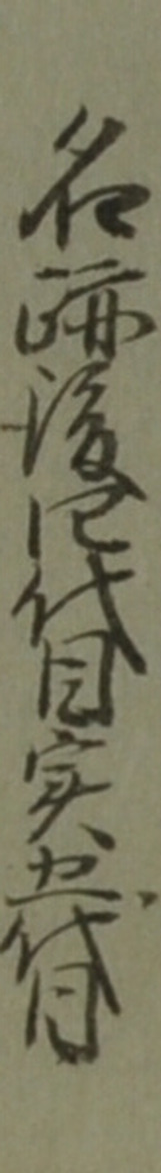名跡後四代目実五代目
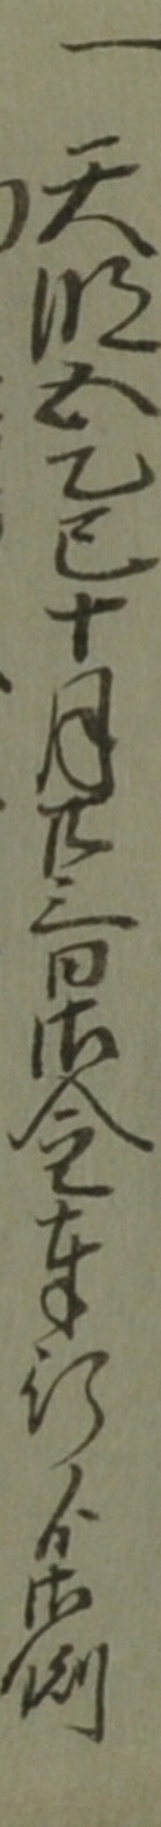一天明五乙巳十月廿三日御金奉行ゟ御側
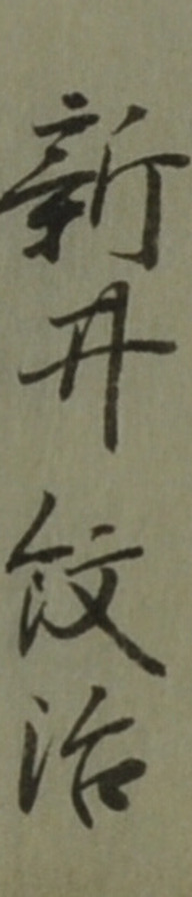新井紋治
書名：諸御役代々録（四）
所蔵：伊那市立高遠町図書館・合同会社AMANE
